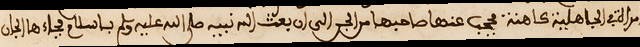امراة في الجاهلية كاهنة فحجب عنها صاحبها من الجن الى ان بعث الله نبيه صلى الله عليه وسلم باسلام فجاءها الجان
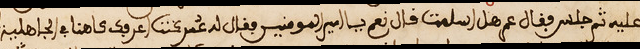عليه ثم جلس فقال عمر هل اسلمت قال نعم يا امير المومنين فقال له عمر كنت اعرفك كاهنا في الجاهلية
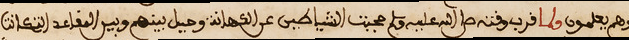وهم يعلمون ولما قرب وقته صلى الله عليه وسلم حجبت الشياطين عن الكهانة وحيل بينهم وبين المقاعد التي كانت
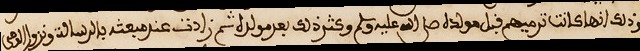وذلك انها كانت ترميهم قبل مولده صلى الله عليه وسلم وكثر ذلك بعد مولده ثم زادت عند مبعثه بالرسالة ونزول الوحى
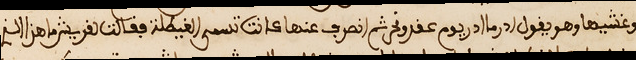وغشيها وهو يقول ادر ما ادر يوم عقر ونحر ثم انصرف عنها كانت تسمى الغيطلة فقالت لقريش ما هذا الذي
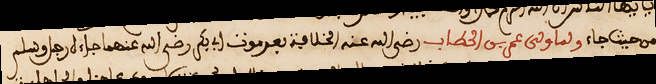من حيث جاء ولما ولى عمر بن الحطاب رضى الله عنه الخلافة بعد موت ابي بكر رضى الله عنهما جاءه رجل وسلم
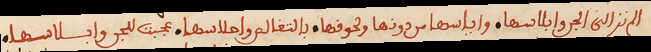الم تر الى الجن وابلاسها واياسها مر دونها ولحوقها بالتغالص واحلاسها عجبت للجن وابلاسها
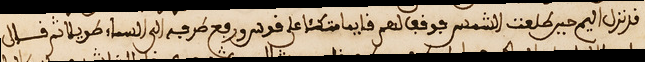قد نزل اليهم حين طلعت الشمس فوقف لهم قايما متكئا على قوس ورفع طرفه الى السماء طويلا ثم قال
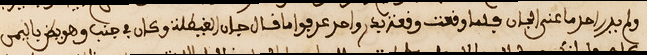ولم يدر احد ما عنى الجان فلما وقعت وقعة بدر واحد عرفوا ما قال جان الغيطلة وكان في جنب وهو بطن باليمن
